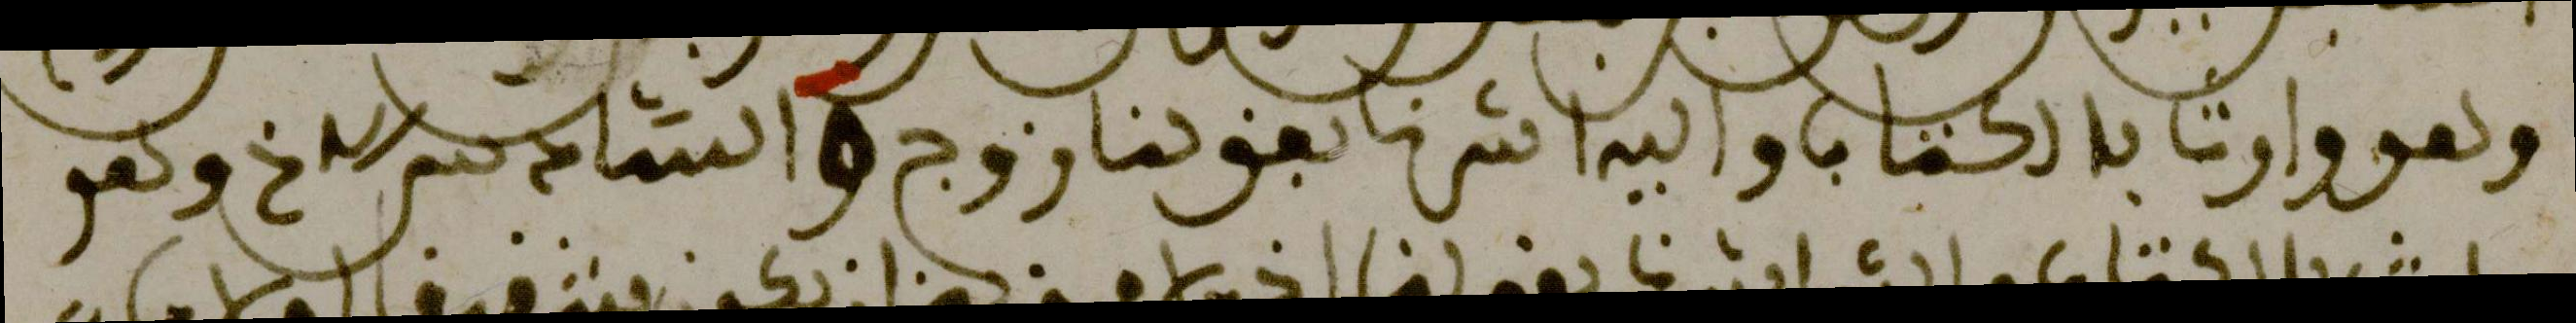وهو وارث بالكتاب واليه اشرنا بقولنا زوج والسّادس الاخ وهو
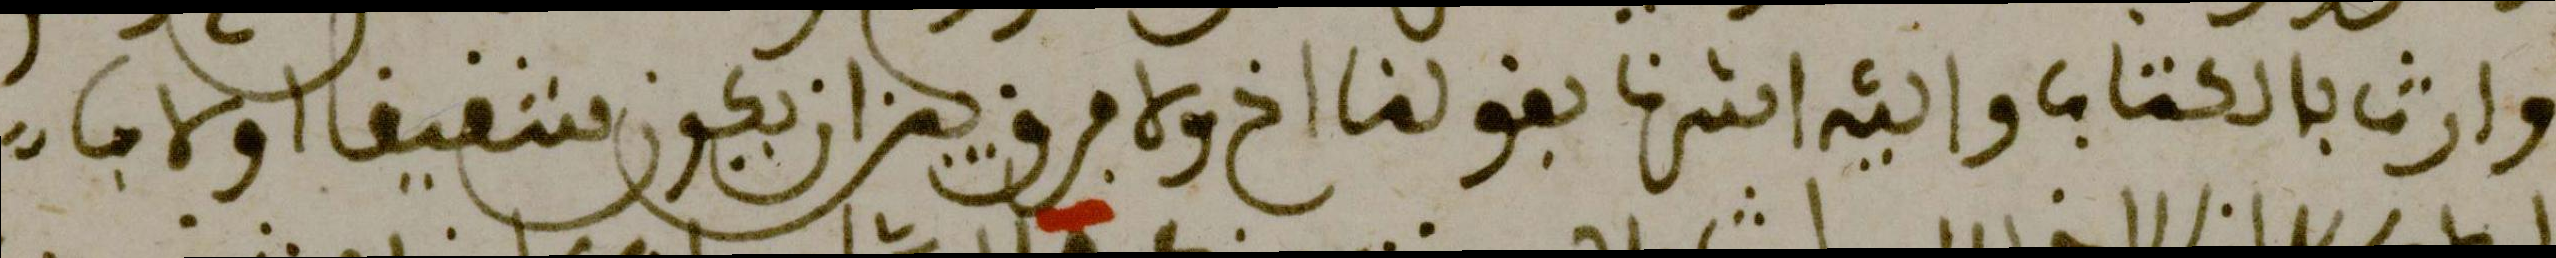وارث بالكتاب واليْه اشرنا بقولنا اخ ولا فرق بين ان يكون شقيقا او لاب
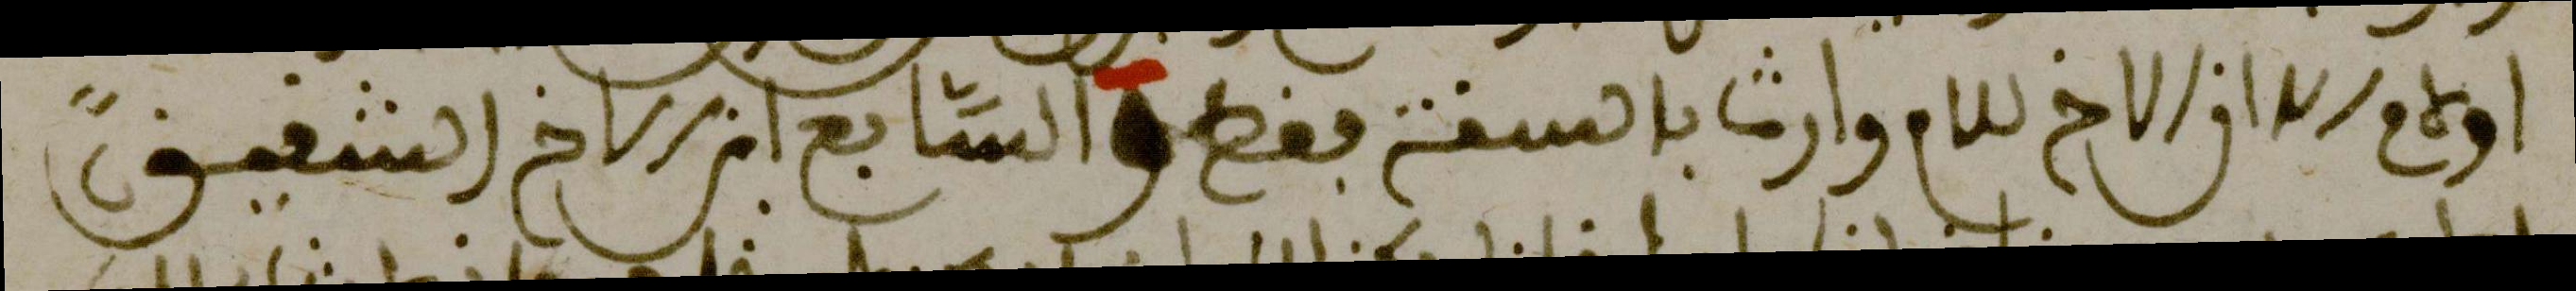او لام الا ان الاخ للام وارث بالسنة فقط والسّابع ابن الاخ الشقيق
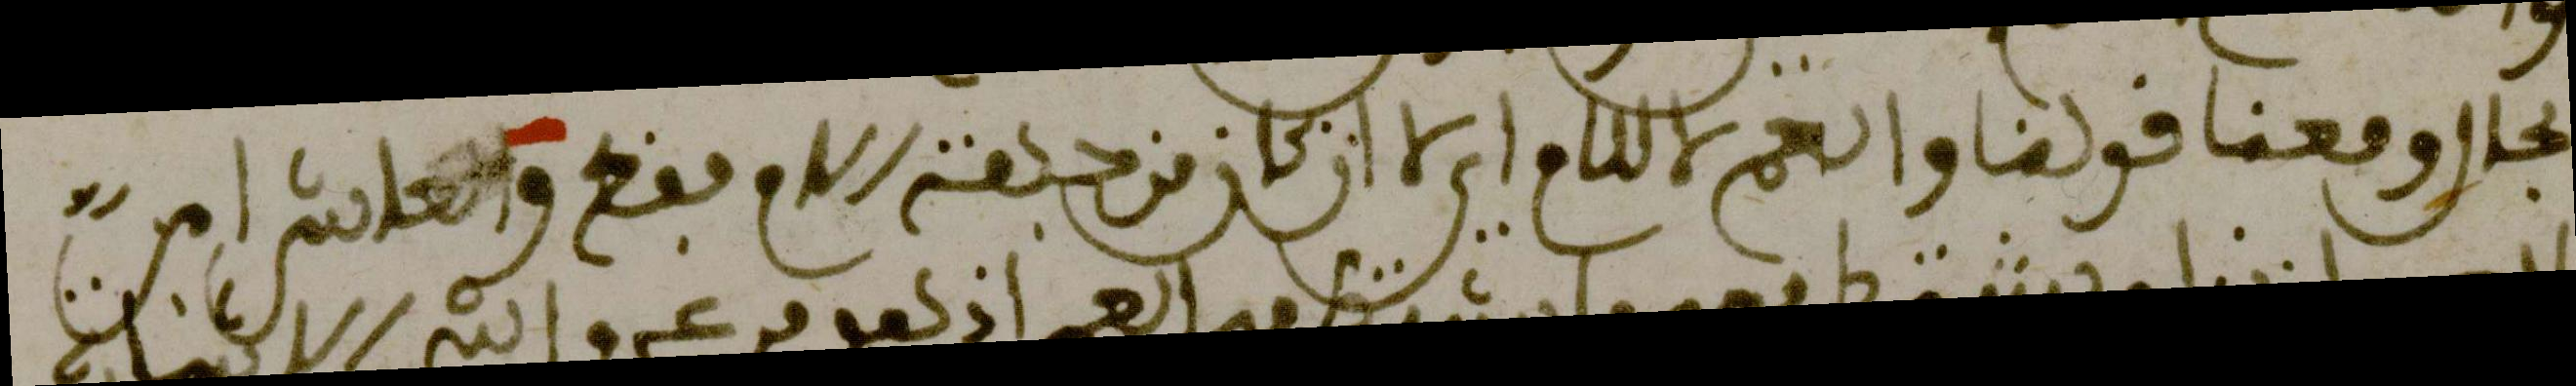بحال ومعنا قولنا والعم لا للام اي لا ان كان من جهة الام فقط والعاشر ابن
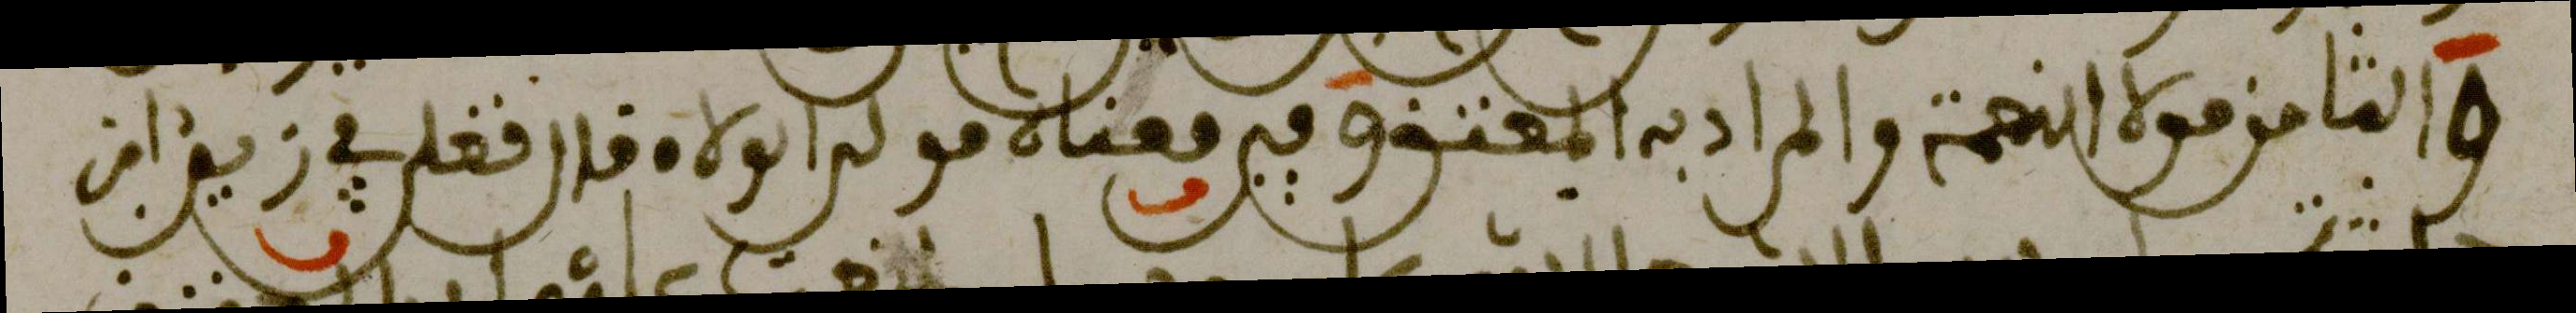والثامن مولا النعمة والمراد به المعتق وفي معناه مولى الولاء قال تعلى في زيد بن
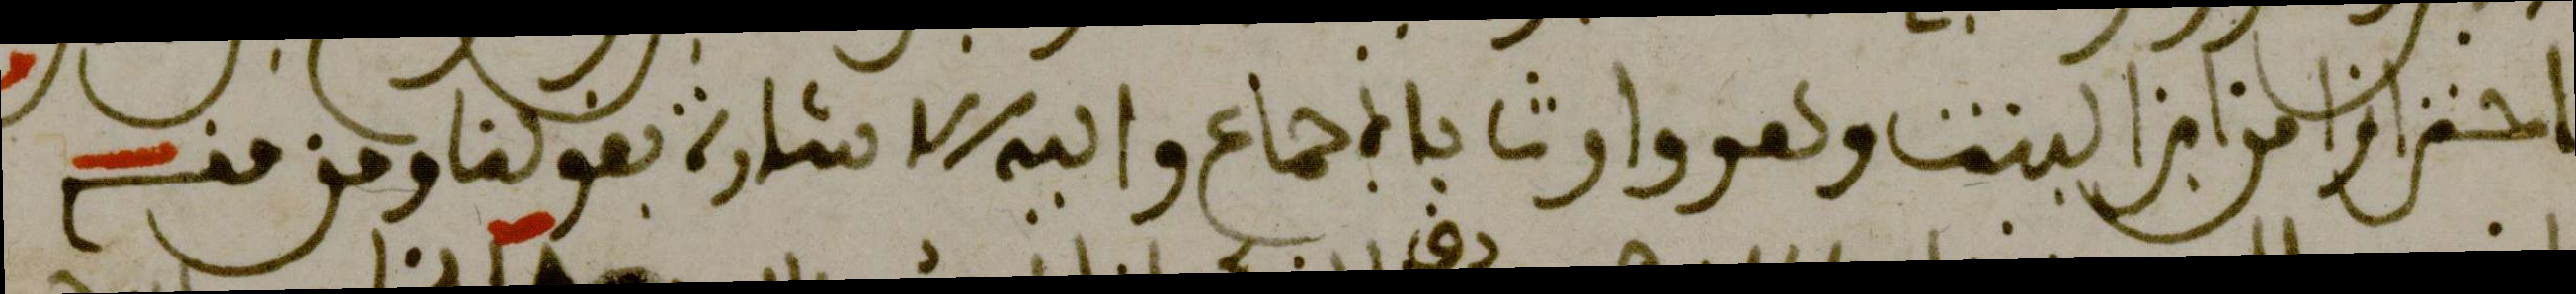احترا زامن ابن البيت وهو وارث بالاجماع واليه الاشارة بقولنا ومن منه
